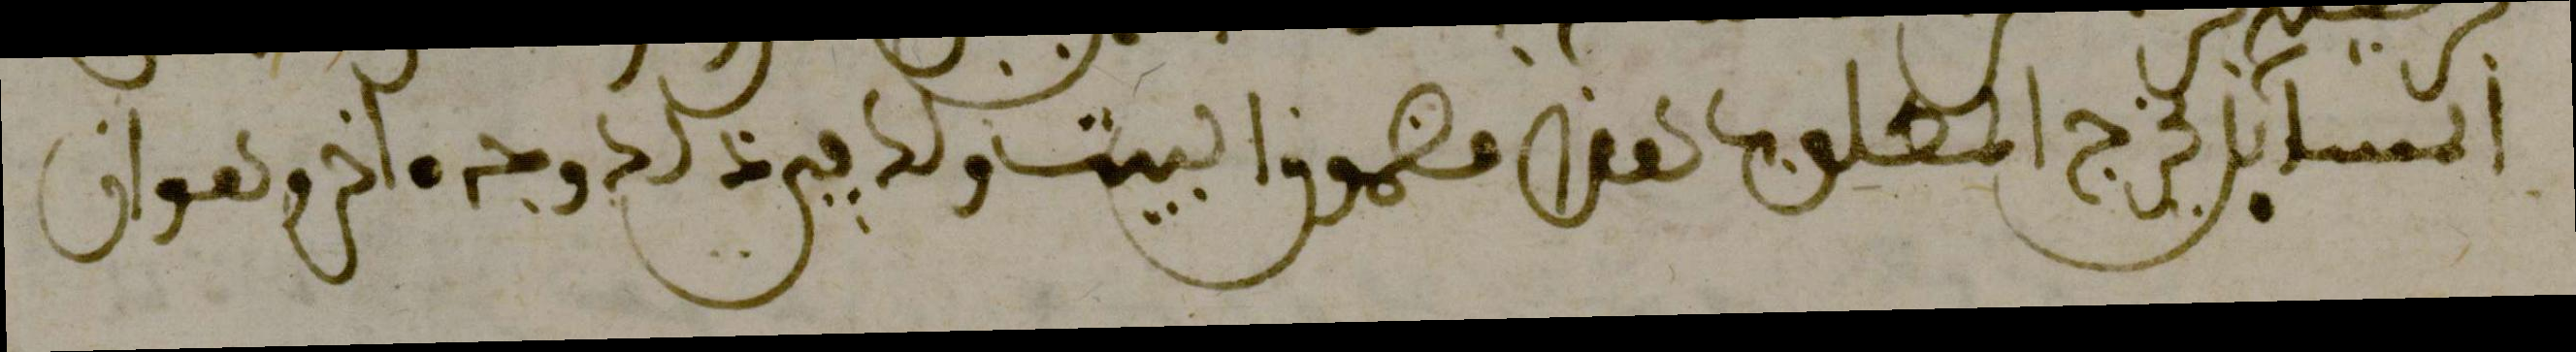المسائل يخرج المطلوب هذا مضمون البيت ولك في ذلك وجه ءاخر وهو ان
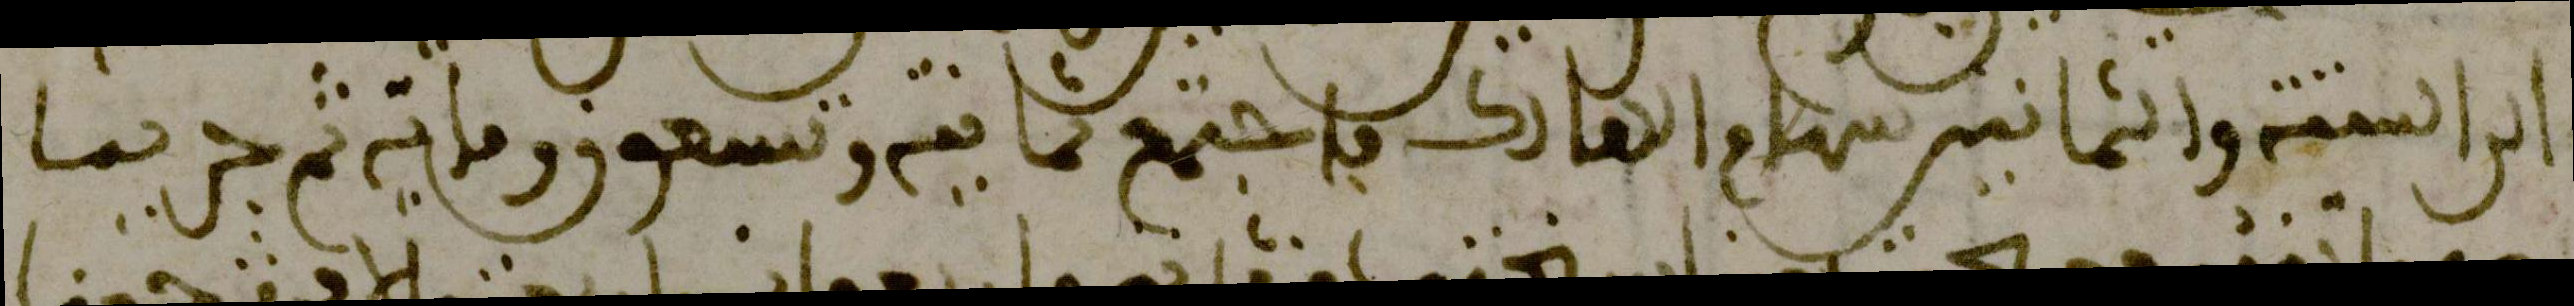الى الستة والثمانيين سهام الهالك فاجتمع ثمانية وتسبعون وماية ثم جرينا
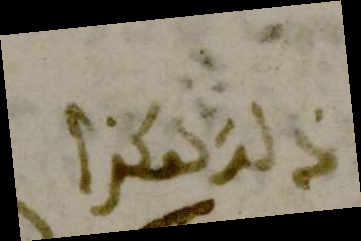ذلك هكذا
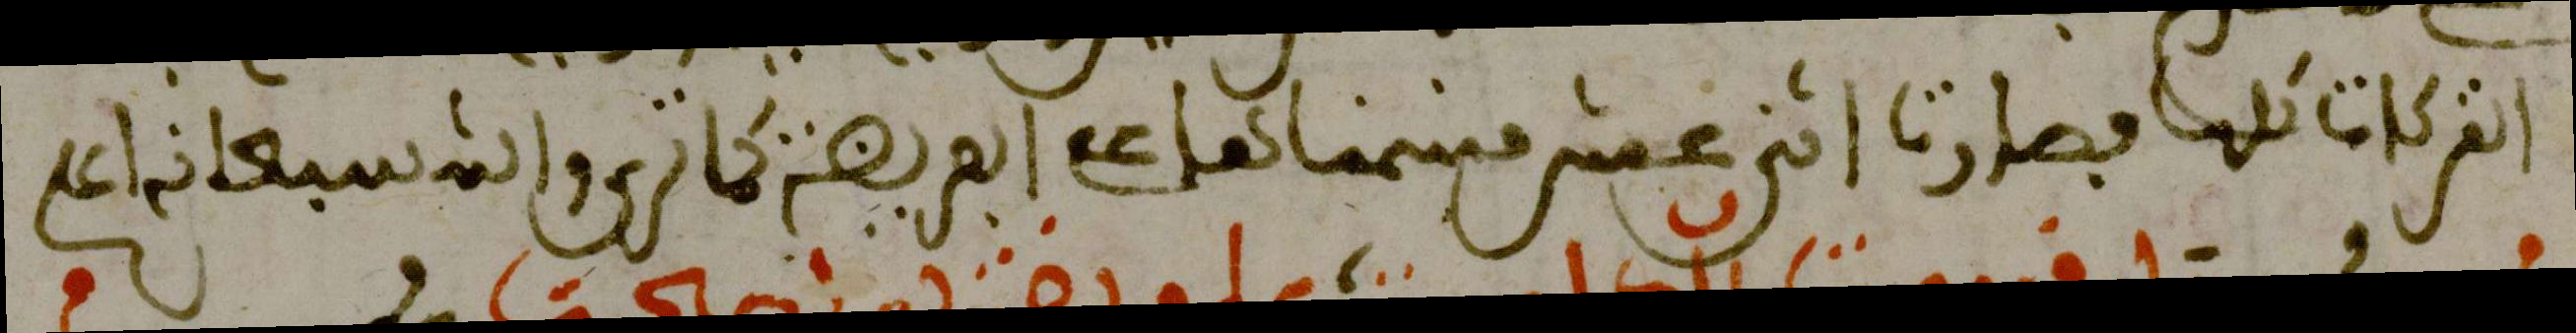التركات كلها فصارت اثنى عشر قسمناها على الفريضة كما ترى والله سبحانه اعلم
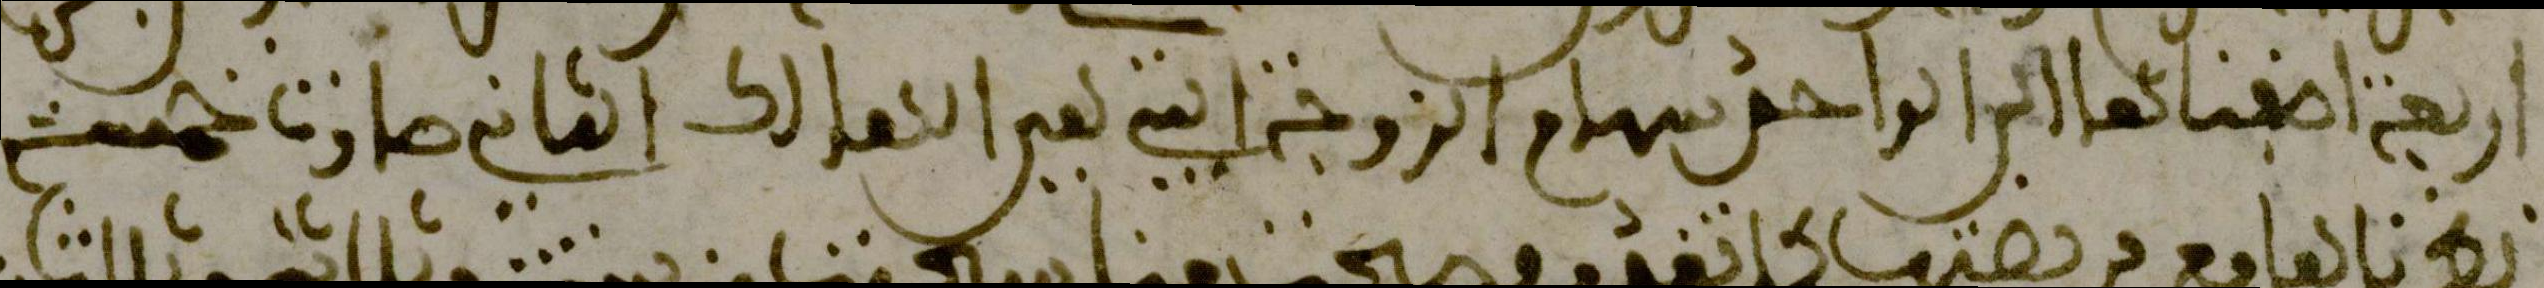اربعة اضفناها الى الواحد سهام الزوجة التي هي الهالك الثاني صارت خمسة
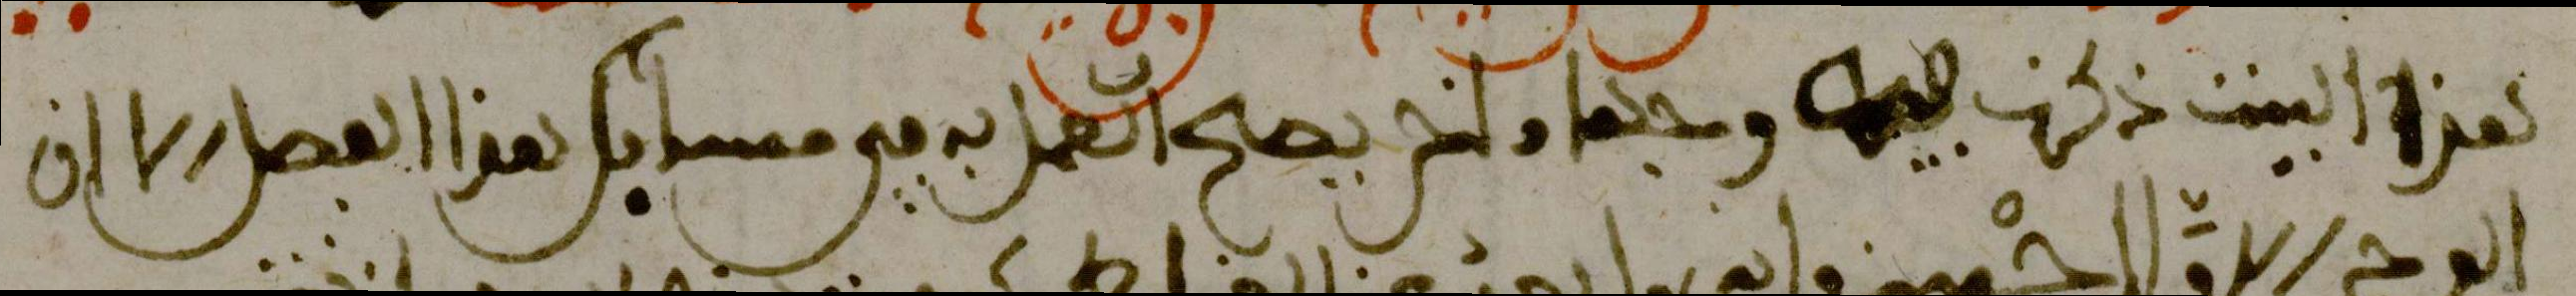هذا البيت ذكرن فيه وجها ءاخر يصح العمل به في مسائل هذا الفصل الا ان
